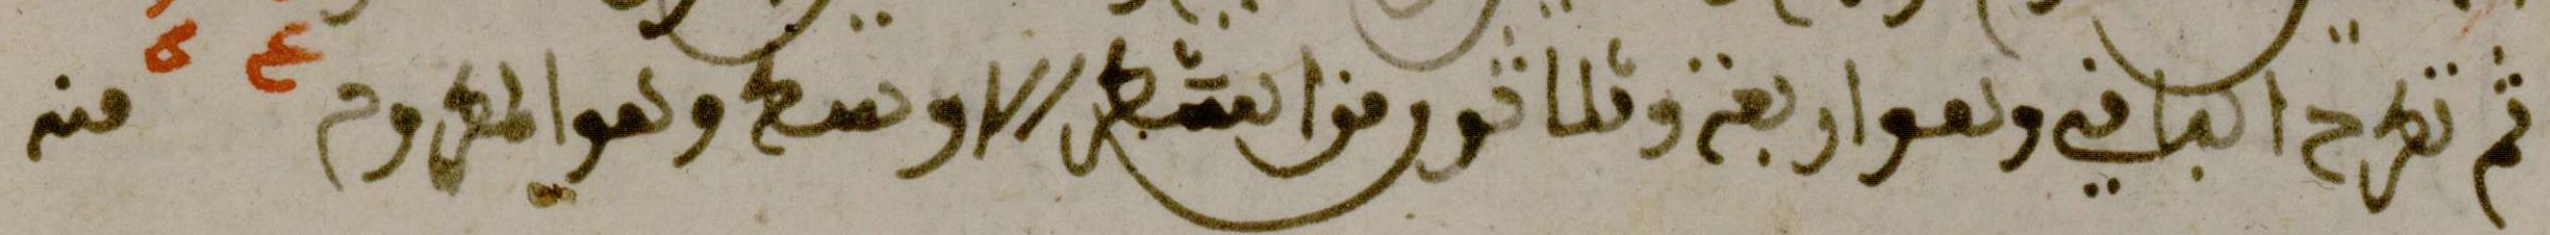ثم تطرح الباقي وهو اربعة و ثلاثون من السطر الأوسط و هو المطروح منه
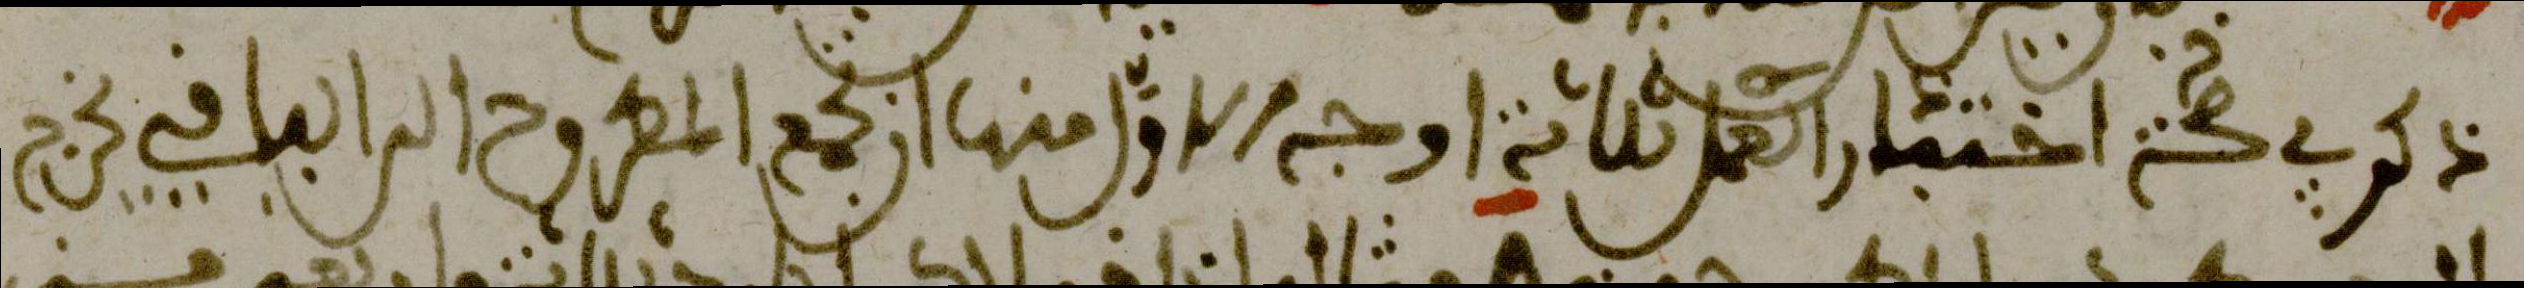ذكر في صحة اختبار العمل ثلاثة اوجه الاوّل منها ان تجمع المطروح الى الباقي يخرج
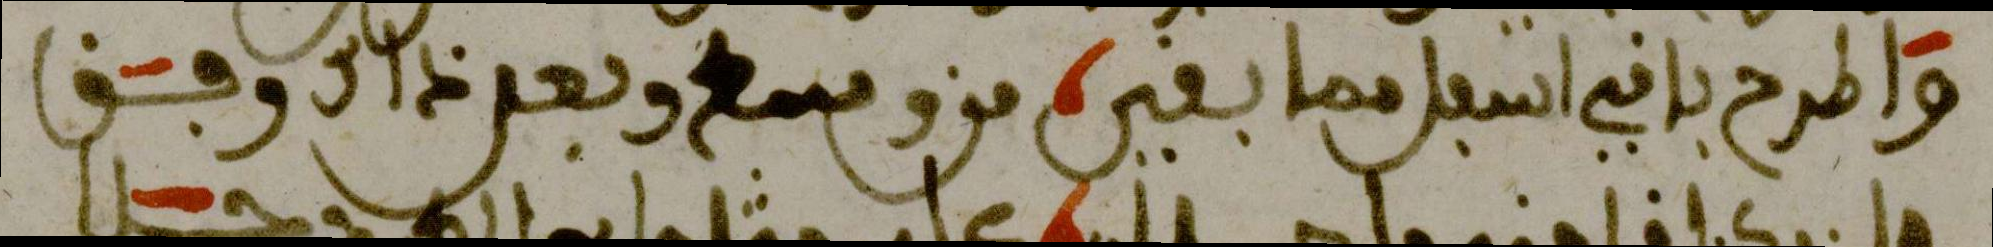وَاطرح باقي اسفل مما بقي من وسط وبعد ذاك وفَق
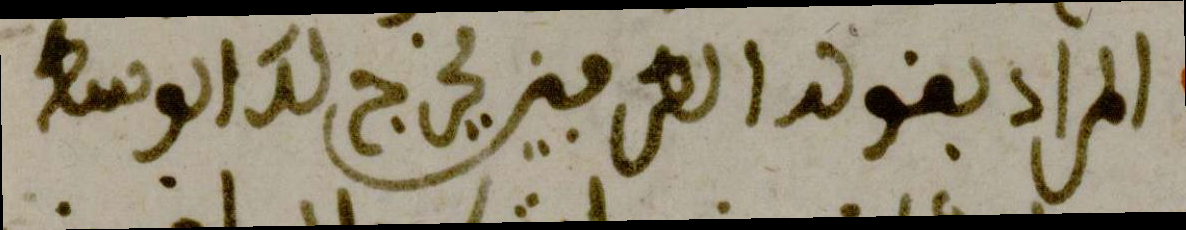المراد بقوله الطرفين يخرج لك الوسط
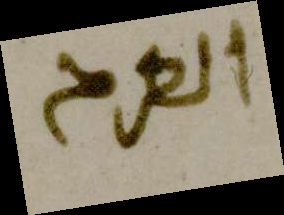الطرح
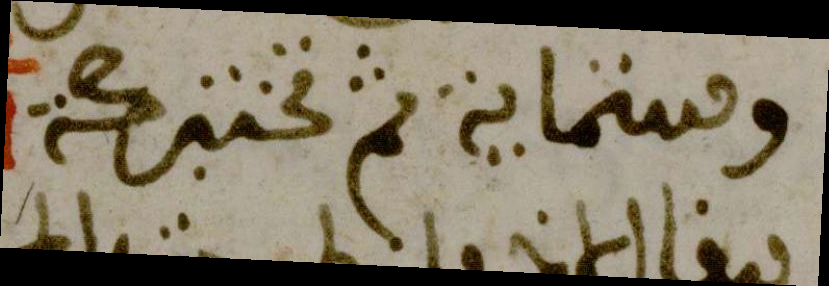و ستماية ثم تختبر صحة
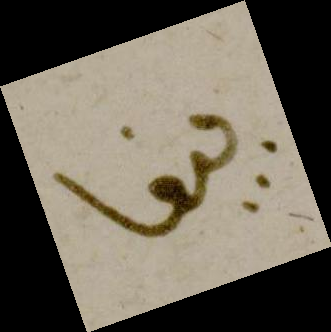يبقا
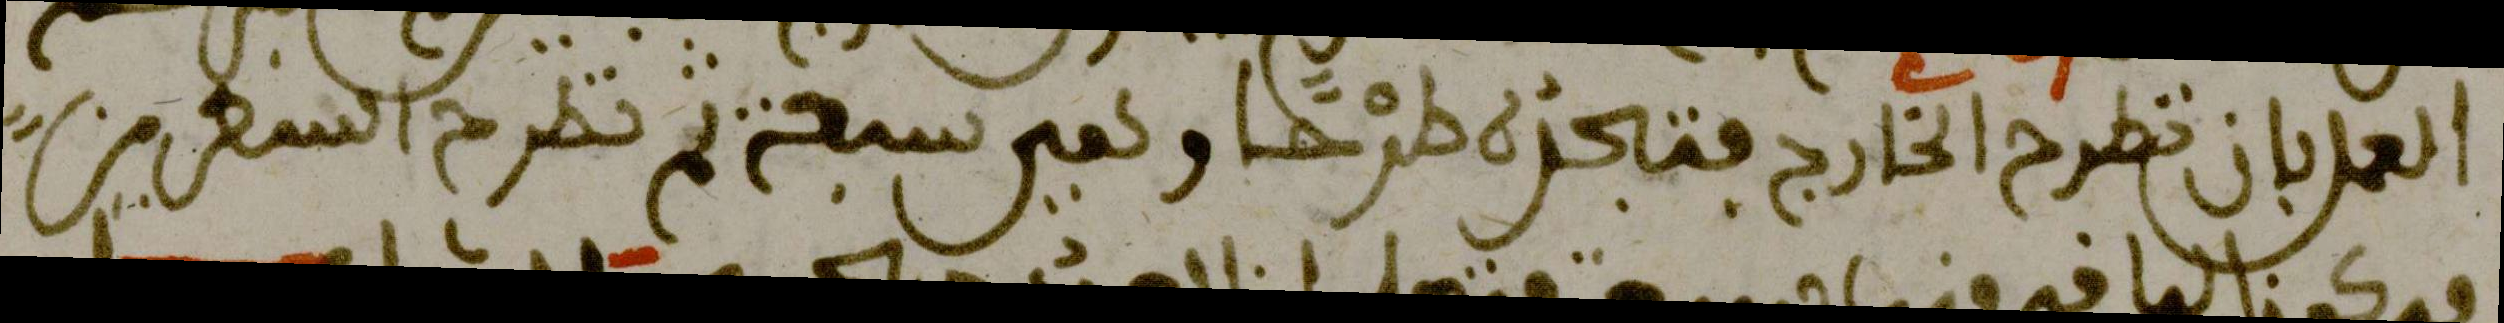العمل بان تطرح الخارج فتجده طرْحًا وهي سبعة ثم تطرح السطرين
